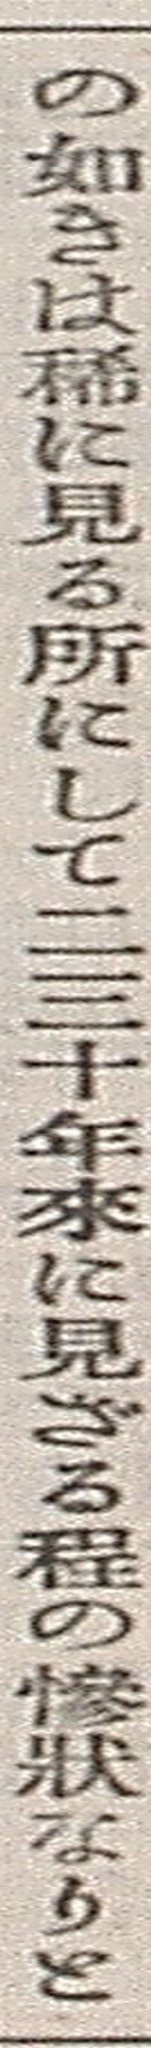の如きは稀に見る所にして二三十年来に見ざる程の惨状なりと
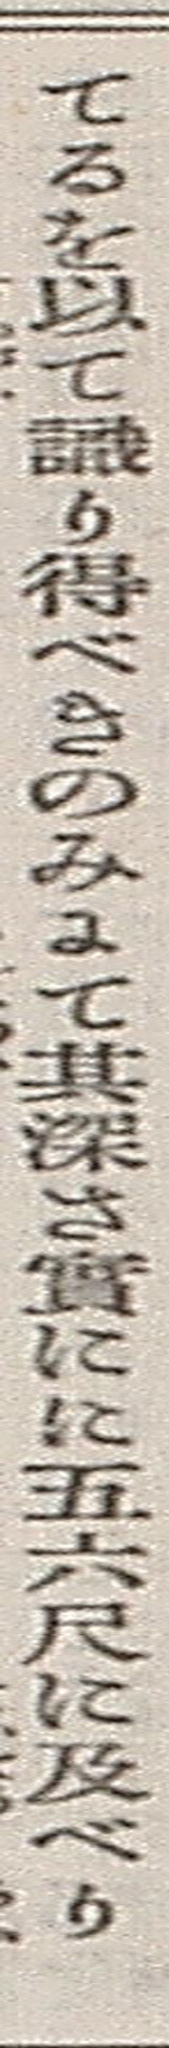てるを以て識り得べきのみにて其深さ実にに五六尺に及べり
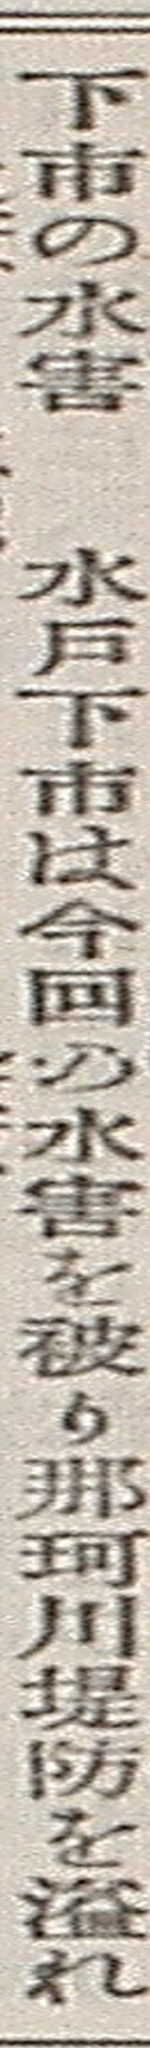下市の水害水戸下市は今回の水害を被り那珂川堤防を溢れ
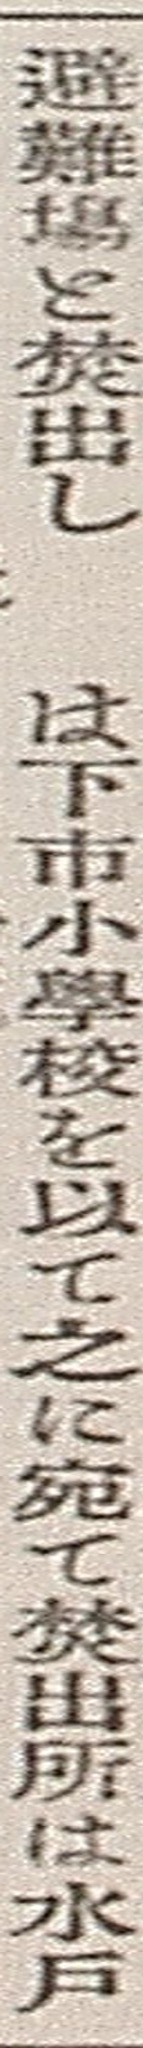避難場と焚出しは下市小学校を以て之に宛て焚出所は水戸
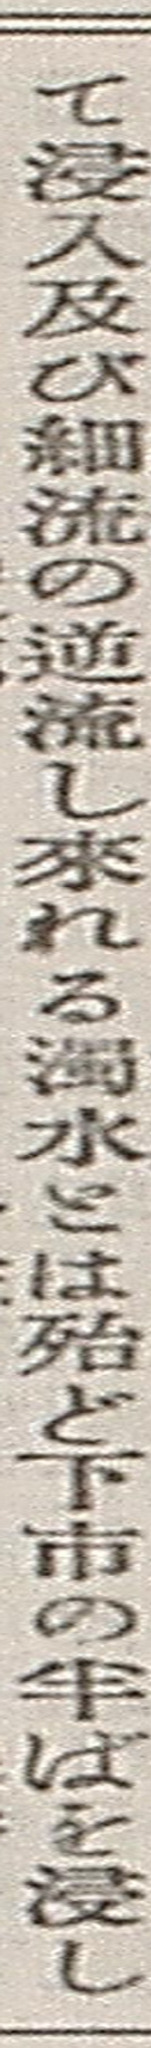て侵入及び細流の逆流し来れる濁水とは殆ど下市の半ばを浸し
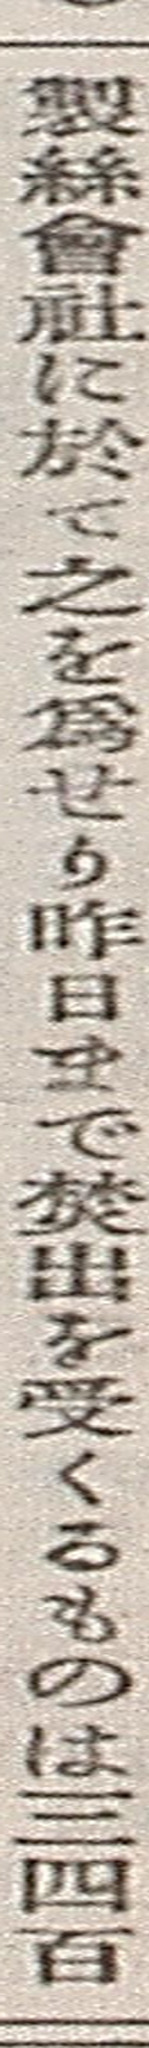製糸会社に於て之を為せり昨日まで焚出を受くるものは三四百
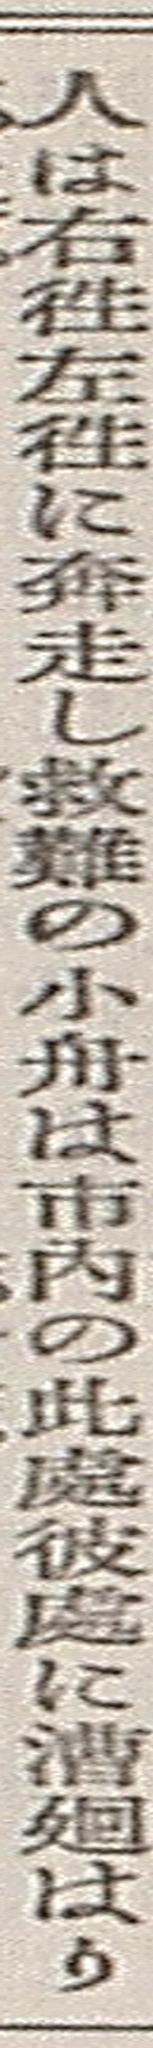人は右往左往に奔走し救難の小舟は市内の此処彼処に漕廻はり
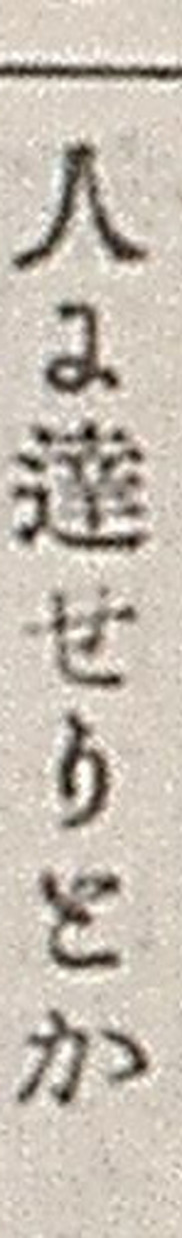人に達せりとか
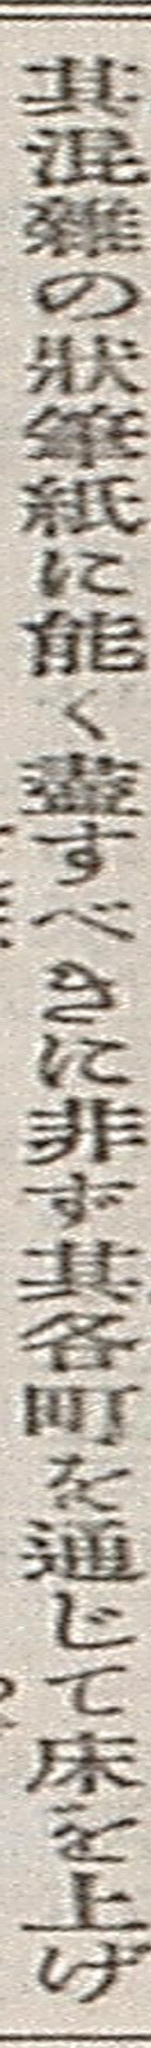其混雑の状筆紙に能く盡すべきに非ず其各町を通じて床を上げ
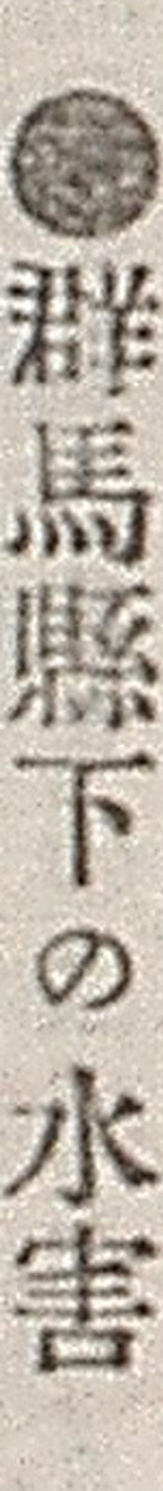●群馬県下の水害
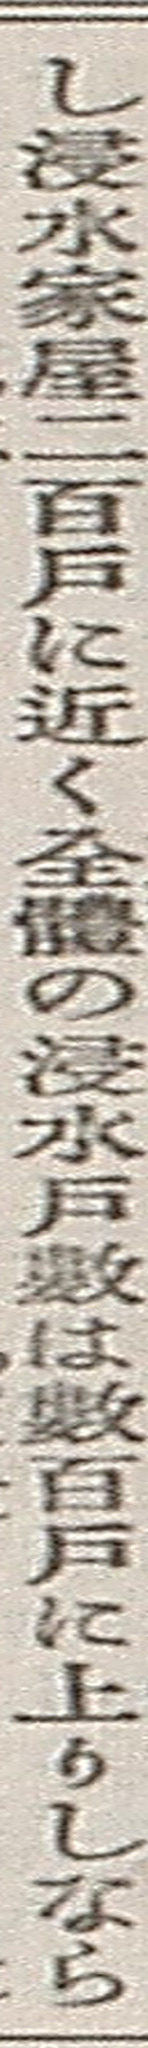し浸水家屋二百戸に近く全体の浸水戸数は数百戸に上りしなら
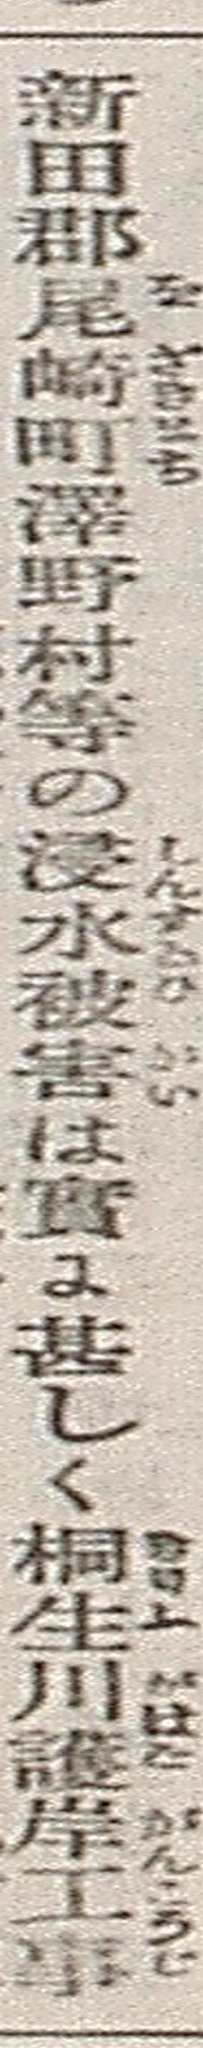新田郡尾崎町澤野村等の浸水被害は実に甚しく桐生川護岸工事
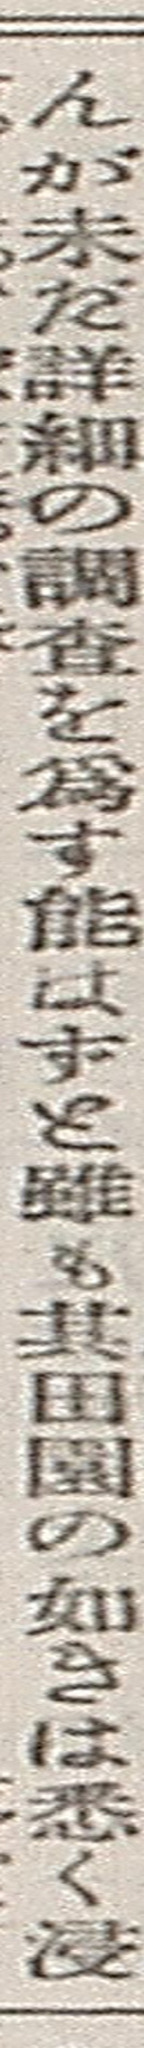んが未だ詳細の調査を為す能はずと雖も其田園の如きは悉く浸
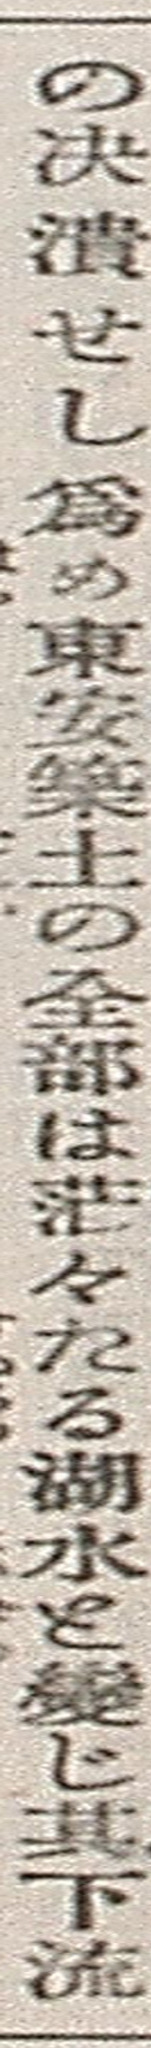の决潰せし為め東安築土の全部は茫々たる湖水と変じ其下流
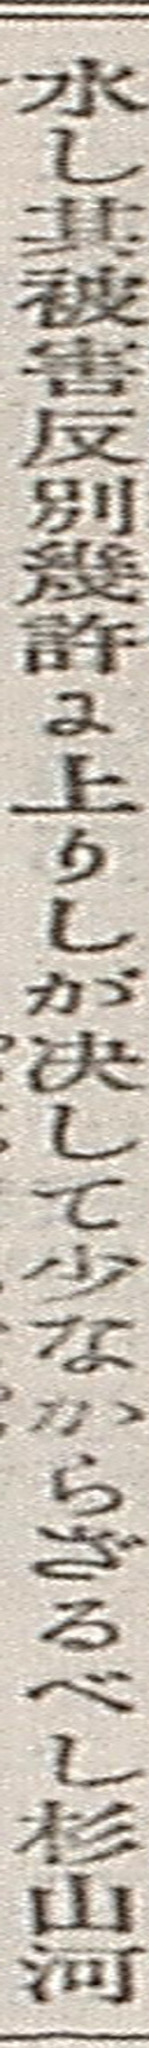水し其被害反別幾許に上りしか决して少なからざるべし杉山河
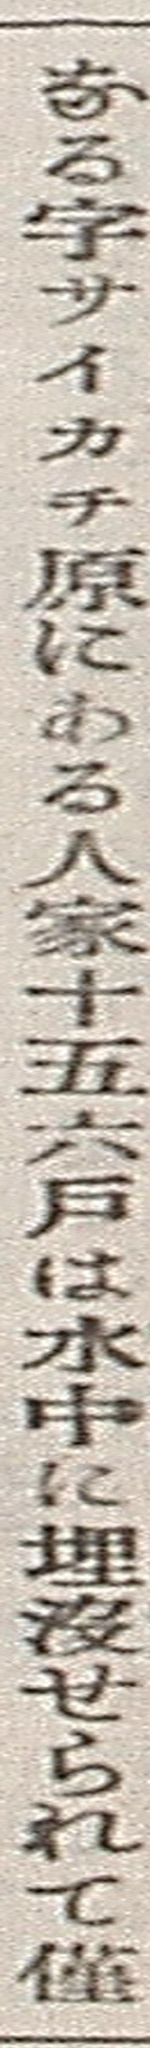なる字サイカチ原にある人家十五六戸は水中に埋没せられて僅
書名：風俗畫報臨時増刊第百二十八號　洪水被害録（下）
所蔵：東京大学地震研究所図書室 Earthquake Research Institute Library, The University of Tokyo, JAPAN
